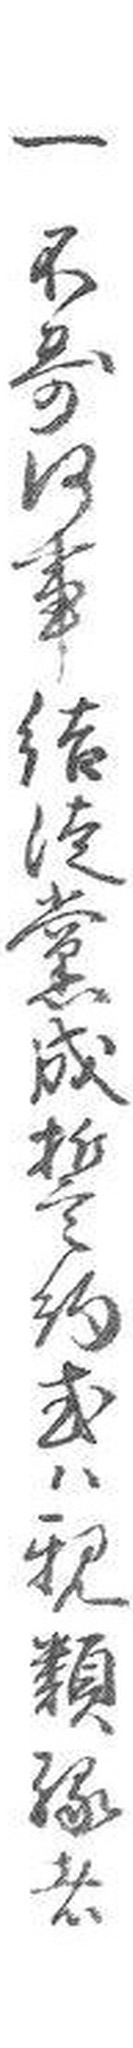一不寄何事結徒党成誓約或ㇵ親類縁者
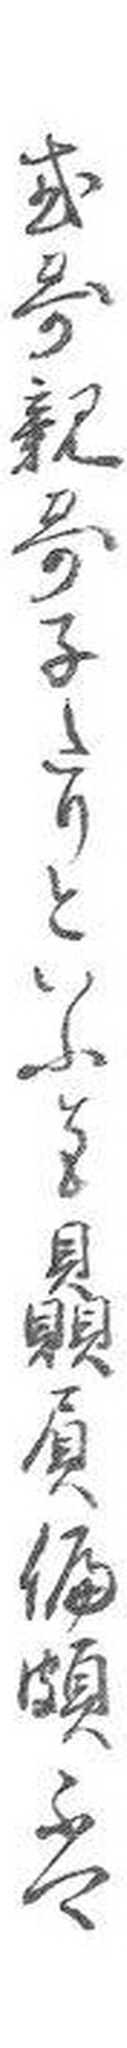或寄親寄子たりといふとも贔屓偏頗不可
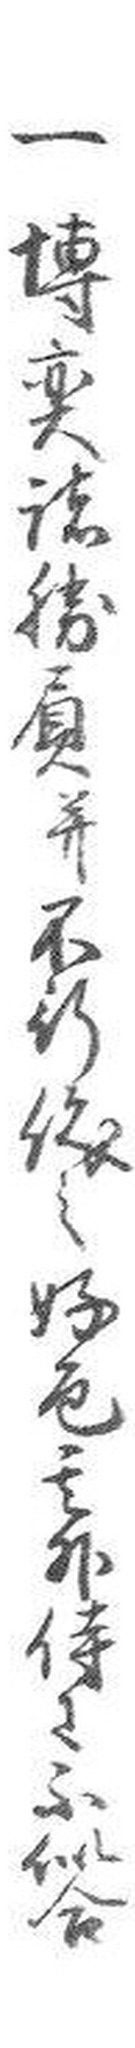一賭博諸勝負幷不行儀之好色其外侍に不似合
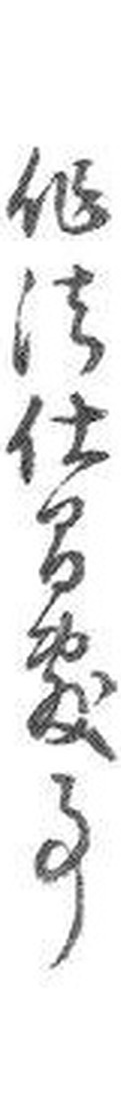作法仕間敷事
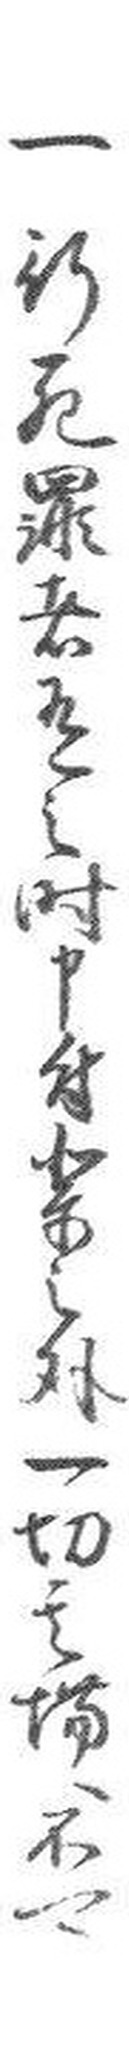一行死罪者有之時申付輩之外一切其場へ不可
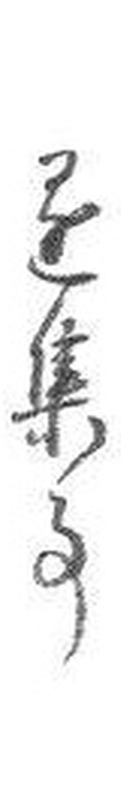懸集事
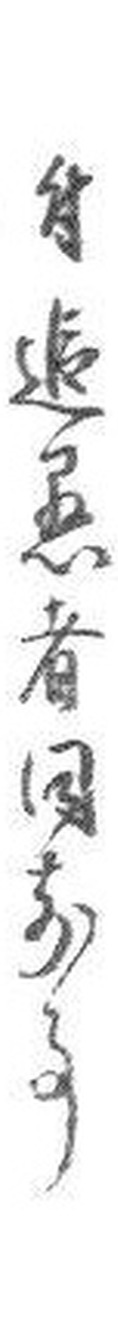付追懸者同前事
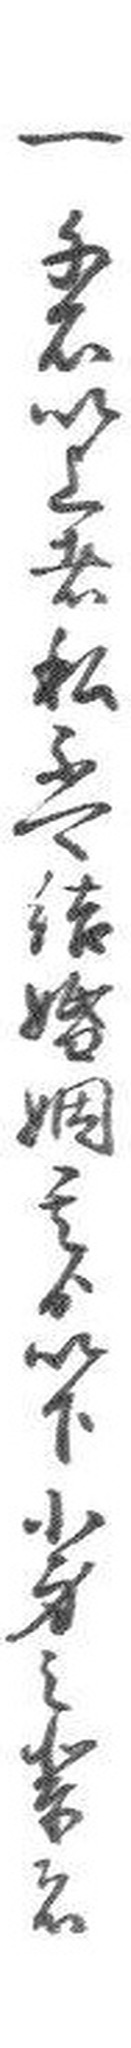一千石以上者私不可結婚姻其ゟ以下小身之輩者
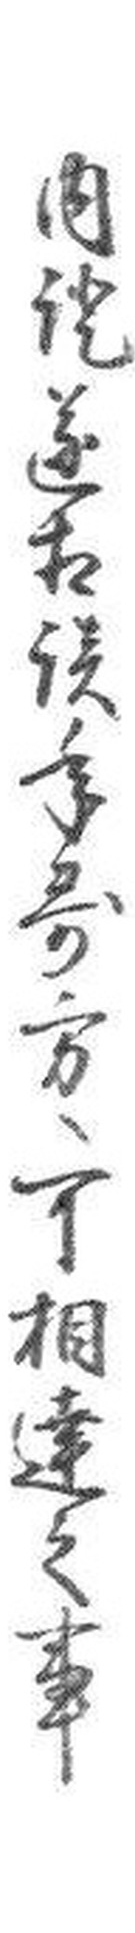内証遂相談年寄方ヘ可相達之事
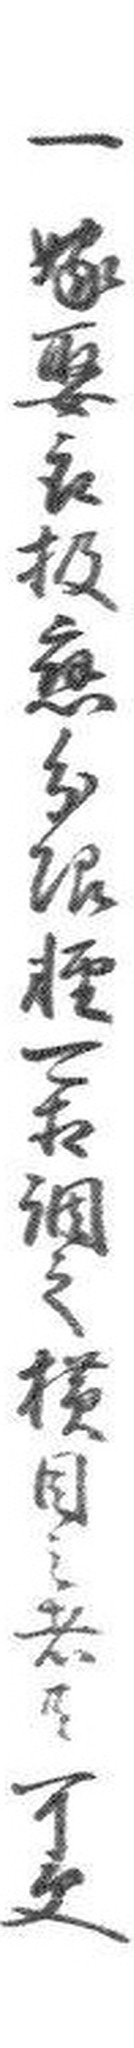一嫁娶取扱応分限軽可相調之横目之者共可受
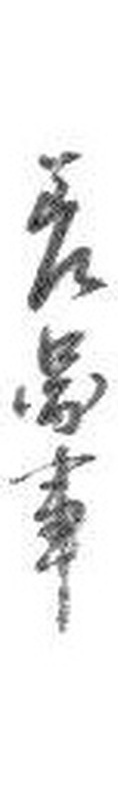差図事
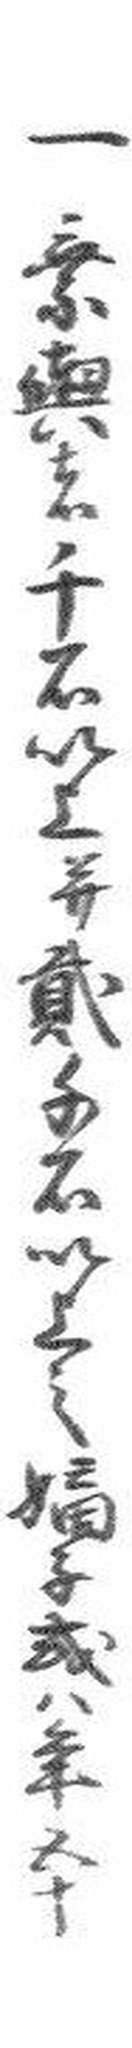一乗輿者千石以上并弐千石以上之嫡子或ㇵ年五十
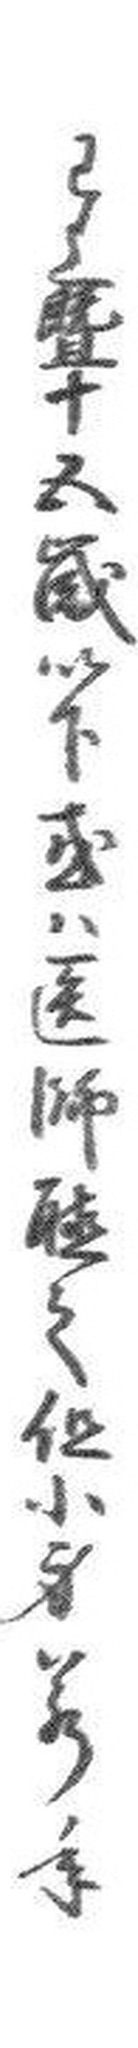已上曁十五歳以下或ㇵ医師聴之但小身若年
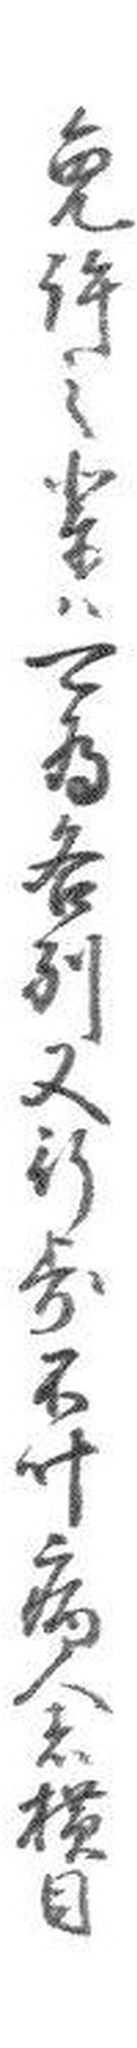免許之輩ㇵ可為各別又行歩不叶病人者横目
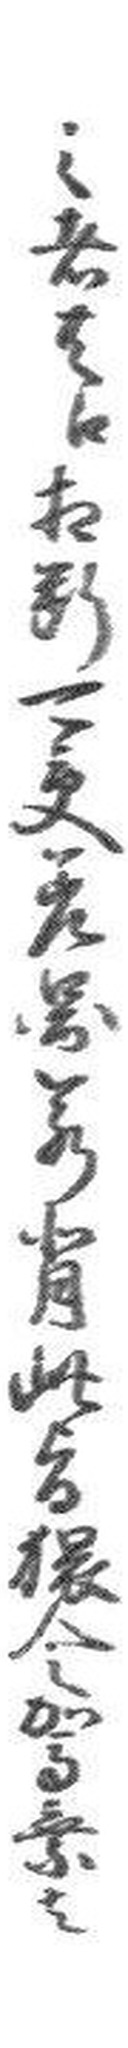之者共江相断可受差図若背此旨猥令駕乗者
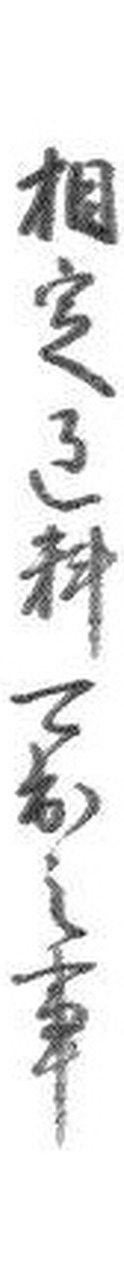相定過料可出之事
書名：家譜 五 光通公 従寛永十三年到万治二年
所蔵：福井県文書館 Fukui Prefectural Archives
